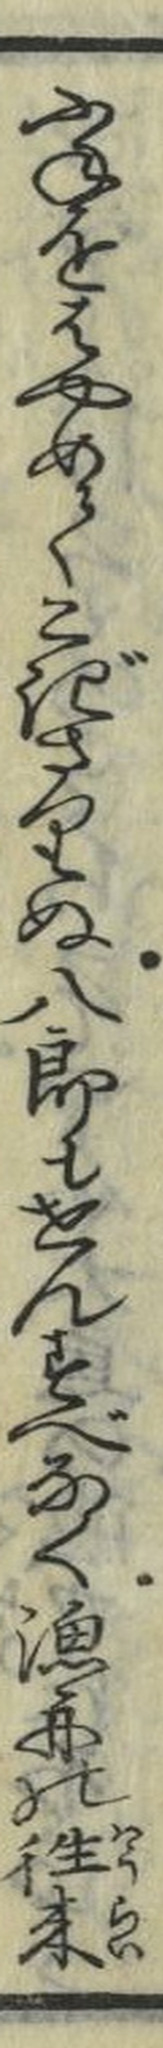ふねをはやめてこぎさりぬ・八郎もせんすべなく・漁に舟の往来
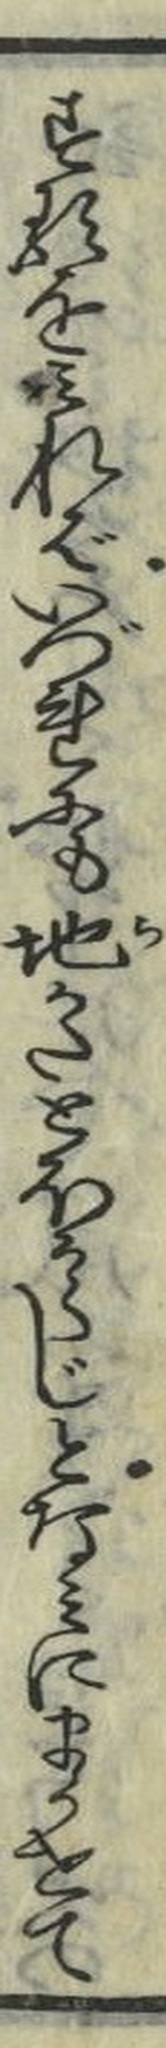するをみれば・いづれにも地かたとほからじと・なみにまかせて
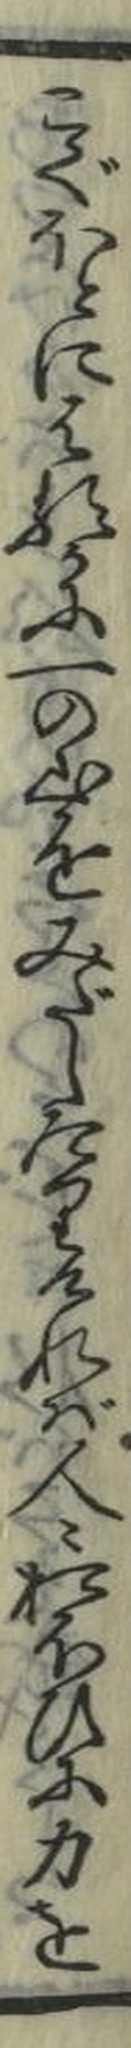こぐほとに・はるかに一の山をみだしたりければ・人々おほいに力を
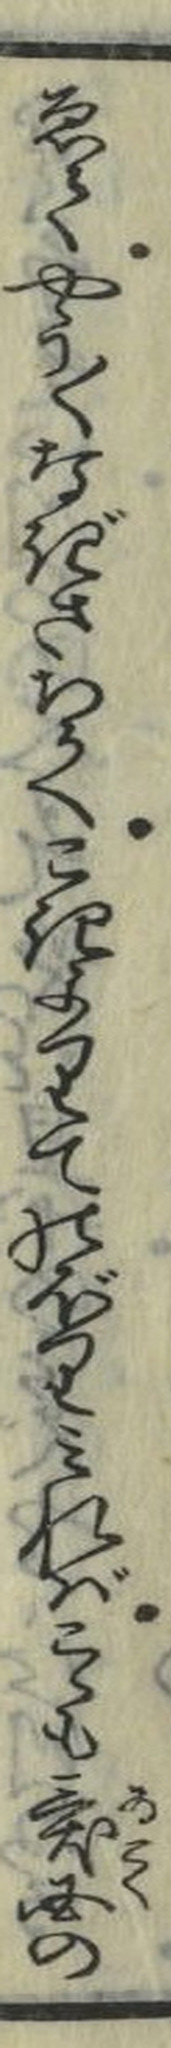ゑて・やう〳〵なぎさちかく・こきよりてのぼりみれば・こゝも異国の
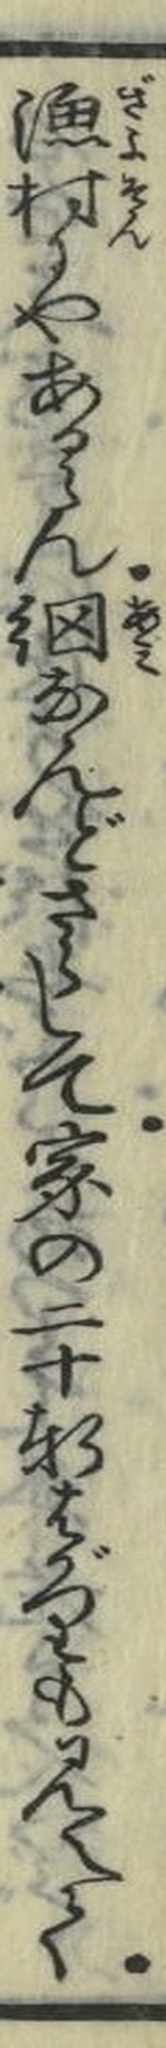漁村にやあるらん・網なんどさらして・家の二十軒はがりも見えて・
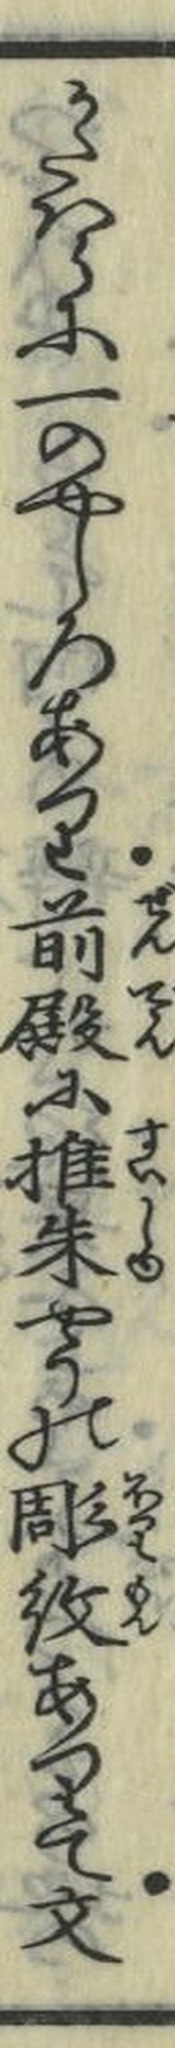かたはらに一のやしろあり・前殿に推朱やうの彫紋ありて・文
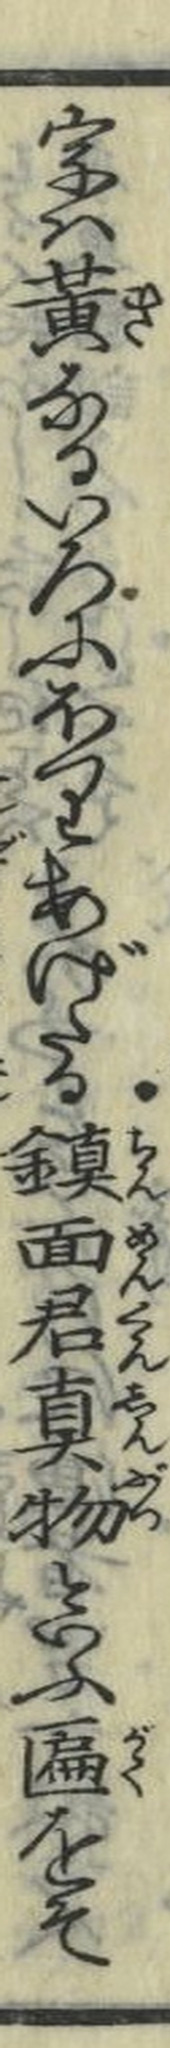字は黄なるいろ・にほりあげたる・鎮面君真物といふ匾をそ
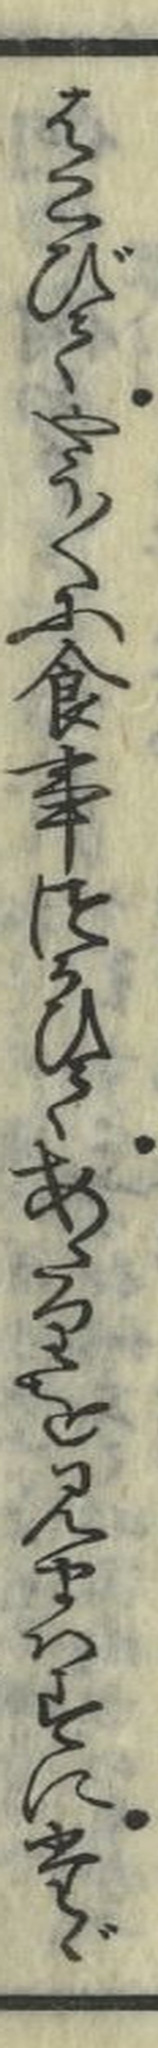はこびて・やう〳〵に食事つかひて・あたりを見まはすに・たゞ
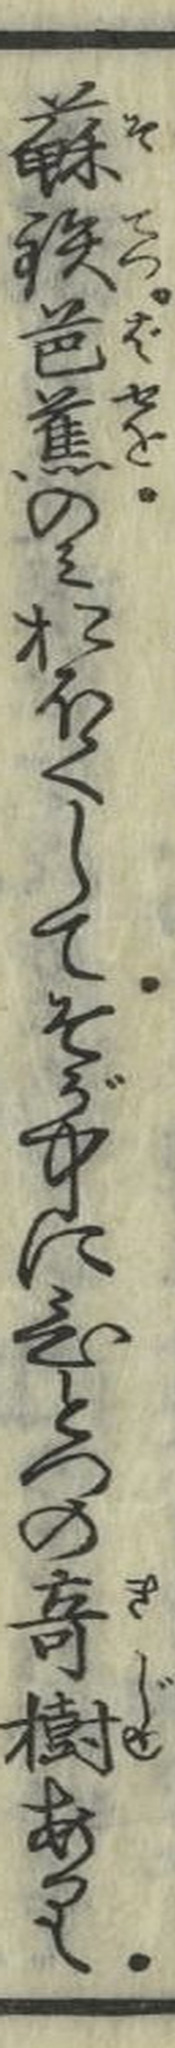蘇鉄・芭蕉のみおほくして・そが中にひとつの竒樹あり・
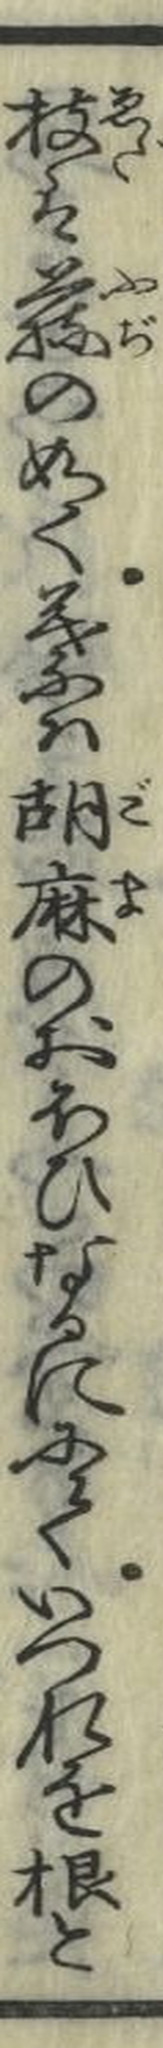枝は藤の如く・葉は胡麻のおほひなるににて・いつれを根と

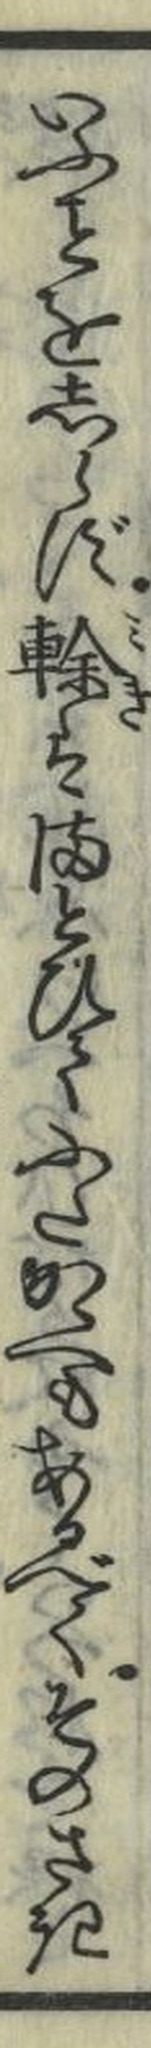いふことをしらず・𨌎はまとひてふたかゝへもあるべく・そのさき
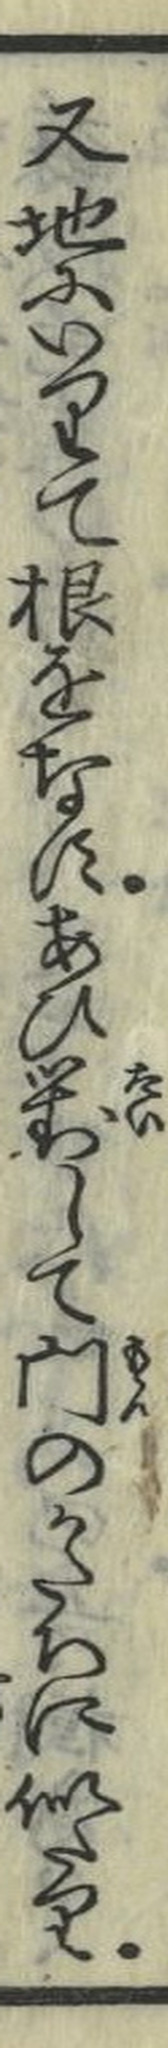又地にいりて根をなす・あひ對して門のかたちににたり・
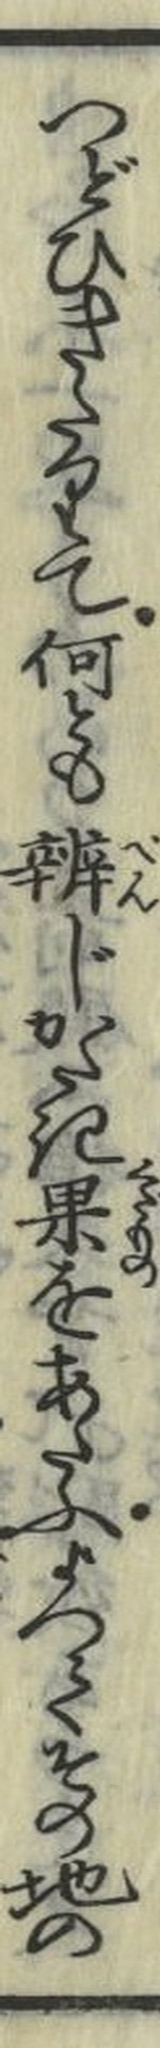つどひきたりて・何とも辨じかたき果をあたふ・よつてその地の
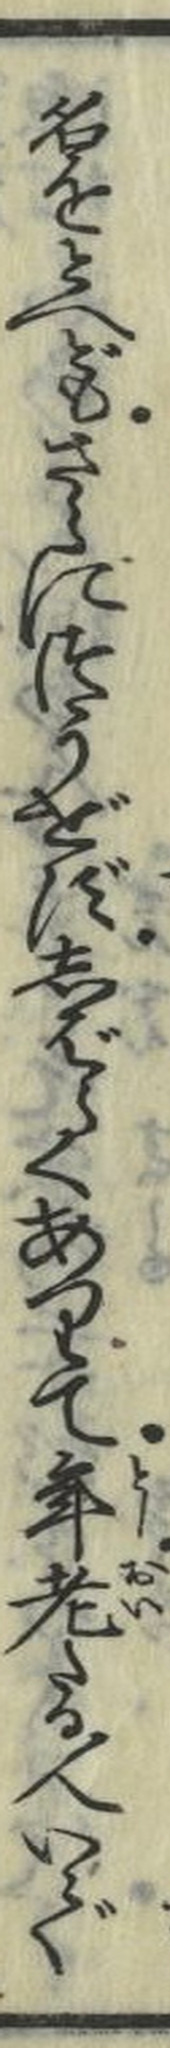名をとへども・さらにつうぜず・しばらくありて・年老たる人いで
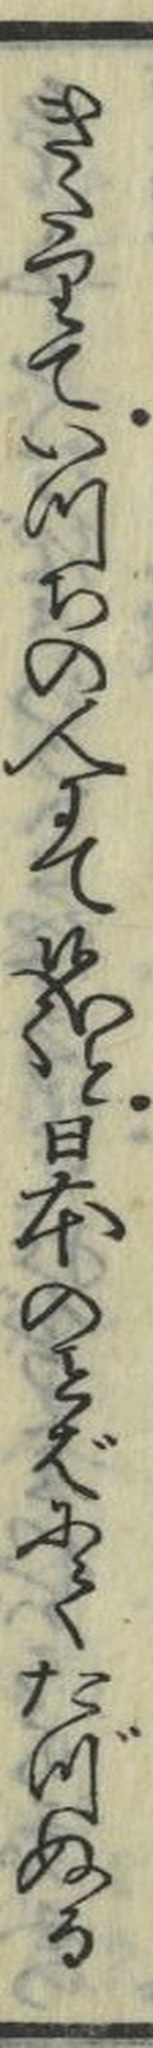きたりて・いつちの人にて候哉と・日本のことばにてたづぬる
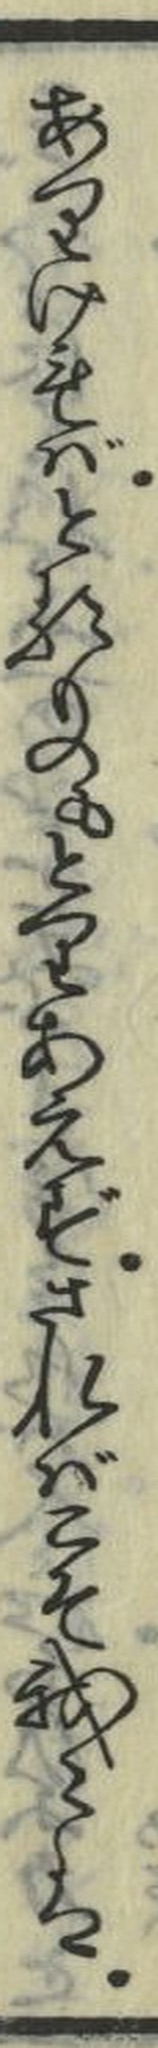ありければ・とるものもとりあえず・さればこそ我々は・
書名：琉球秊代記 附雑話 全
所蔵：University of the Ryukyus Library
